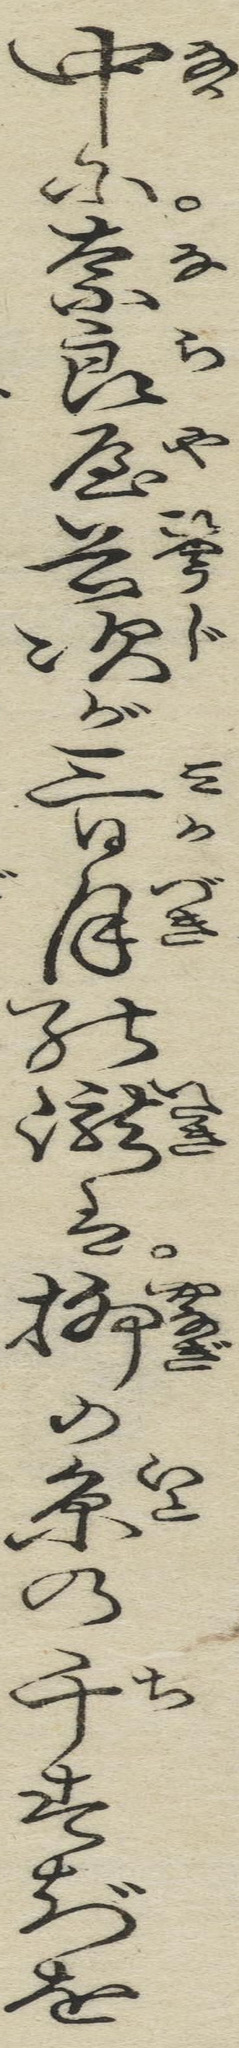中に。奈良屋兵次が三日月の瀧は。柳の糸の千すぢを
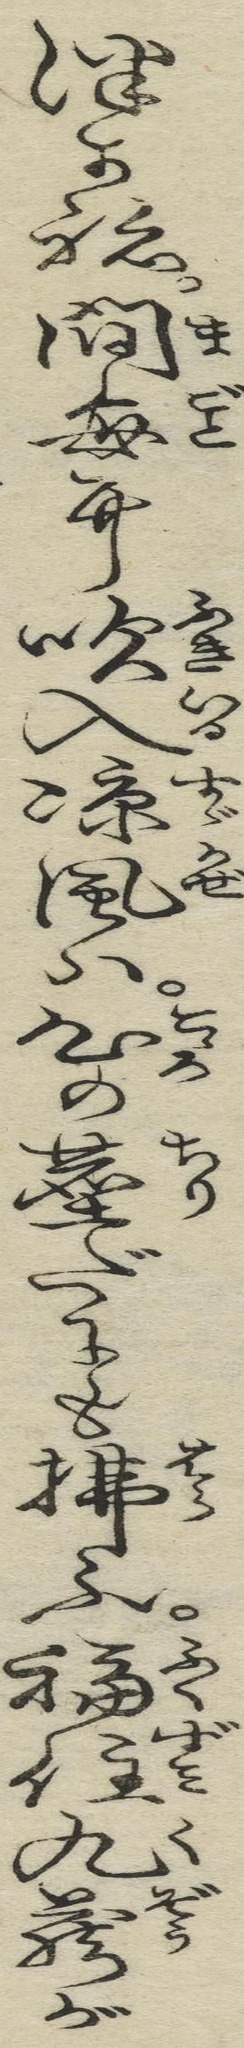に旅。間毎に吹入涼風は。心の塵だにも拂ふ。福住九蔵が
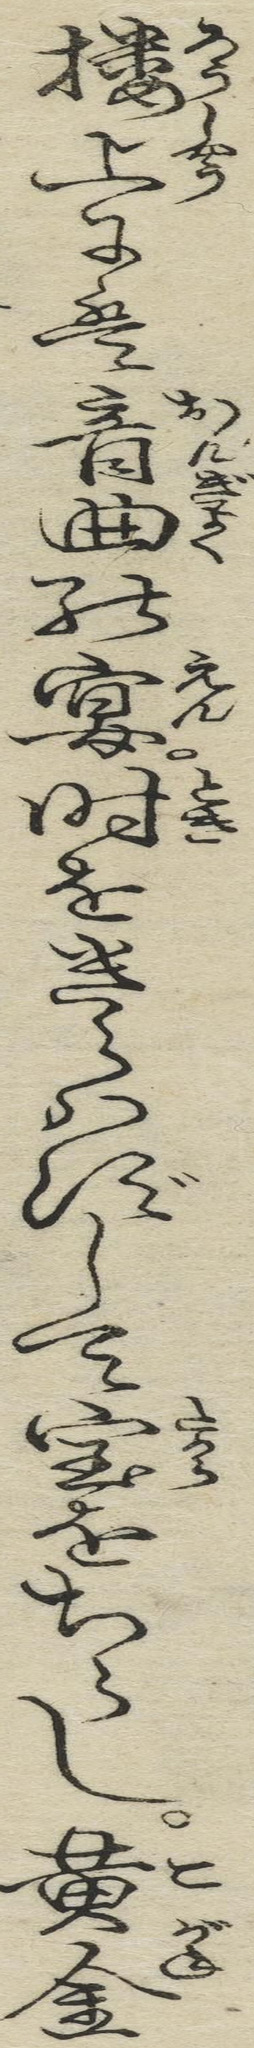楼上に有て音曲の宴。時をきらはずして宝をちらし。黄金
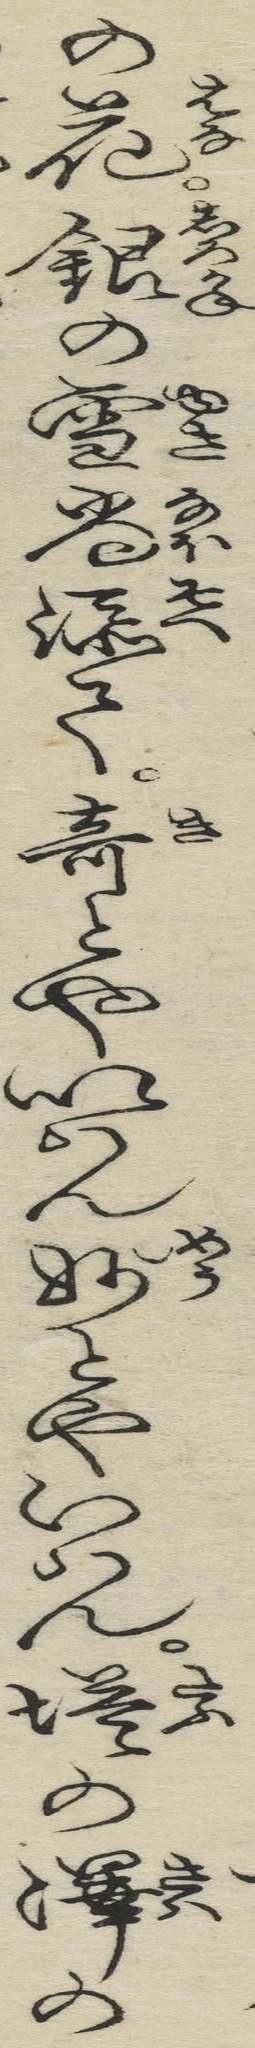の花。銀の雪尚添て。奇とやいはん妙とやいはん。塔の澤の
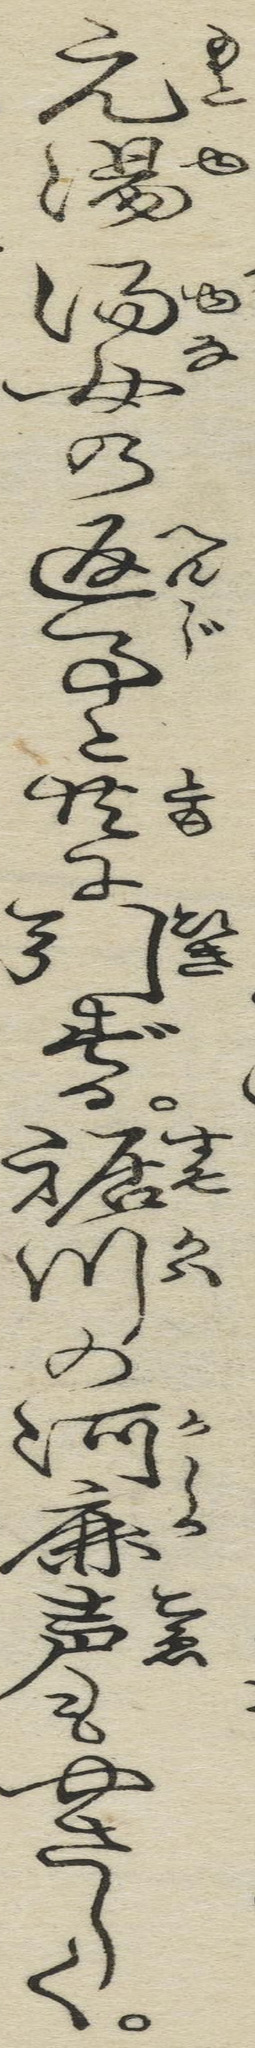元湯湯女の返事と共に引ずる。裾川の河鹿声もやさしく。
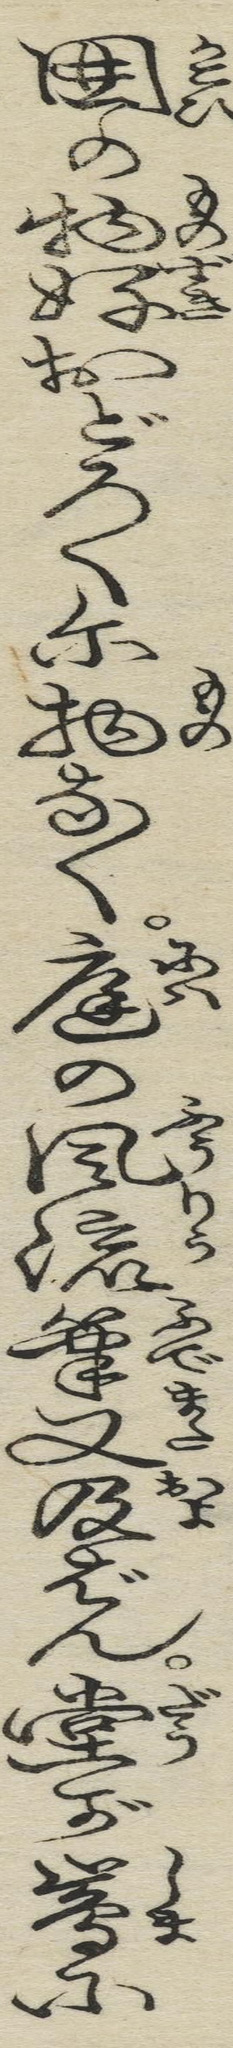囲の物好おどろくに物なく。庭の風流筆又及ばん。堂が島に
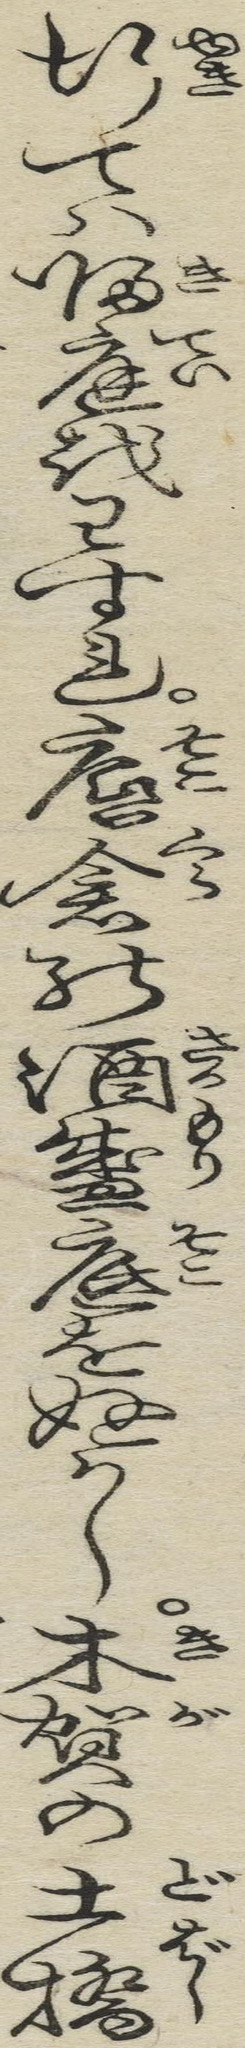行てハ帰？庭をわすれ。底倉の酒盛底をぬらし。木賀の土橋
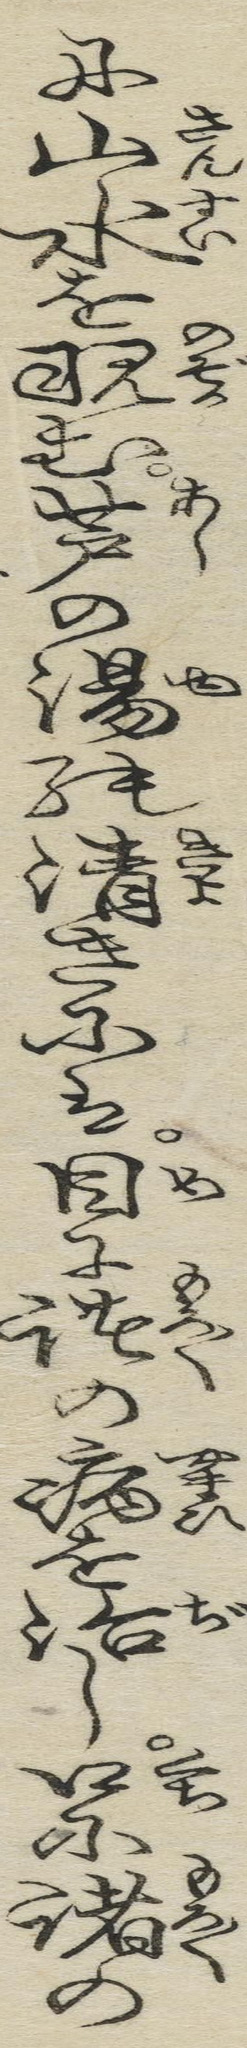に山水を覗む。芦の湯の清きには。目に諸の病を治し。口に諸の
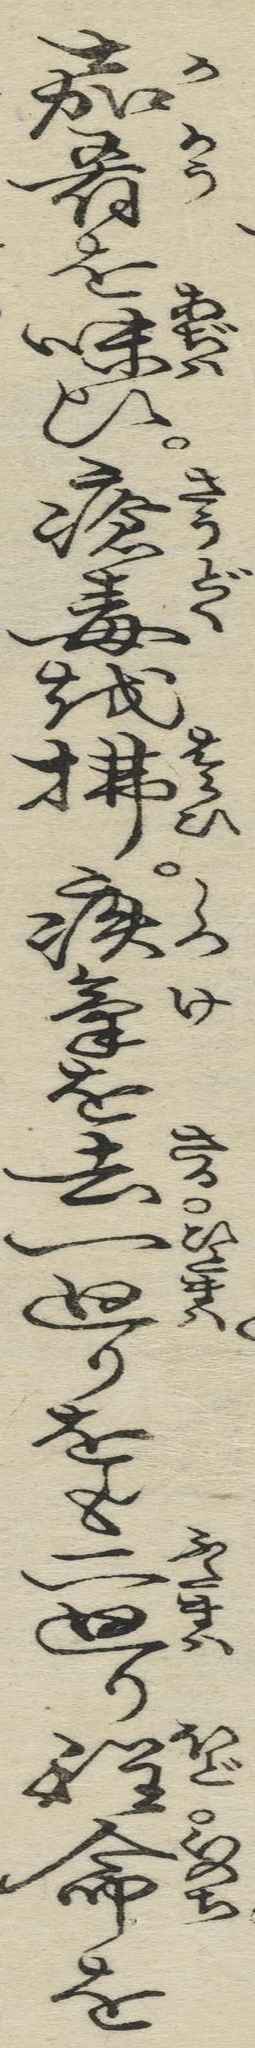嘉肴を味ひ。瘡毒を拂。疾氣を去。一廻りをも二廻り程。命を
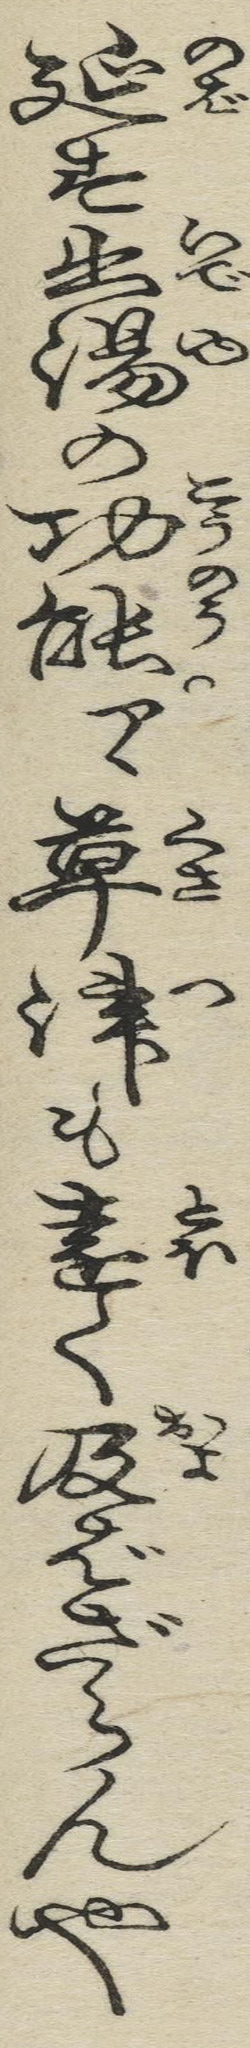延す出湯の効能。アゝ草津も遠く及ばざらんや
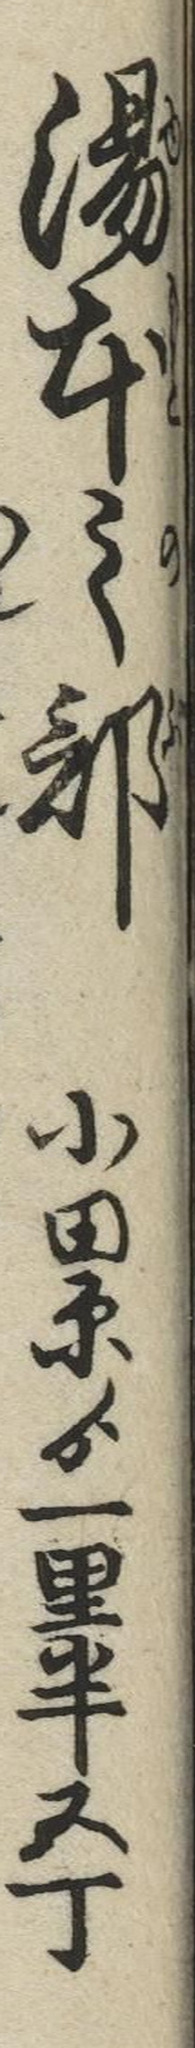湯本之部小田原ゟ一里半五丁
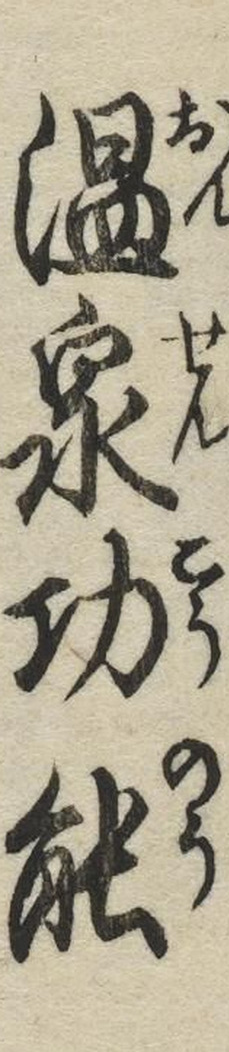温泉功能
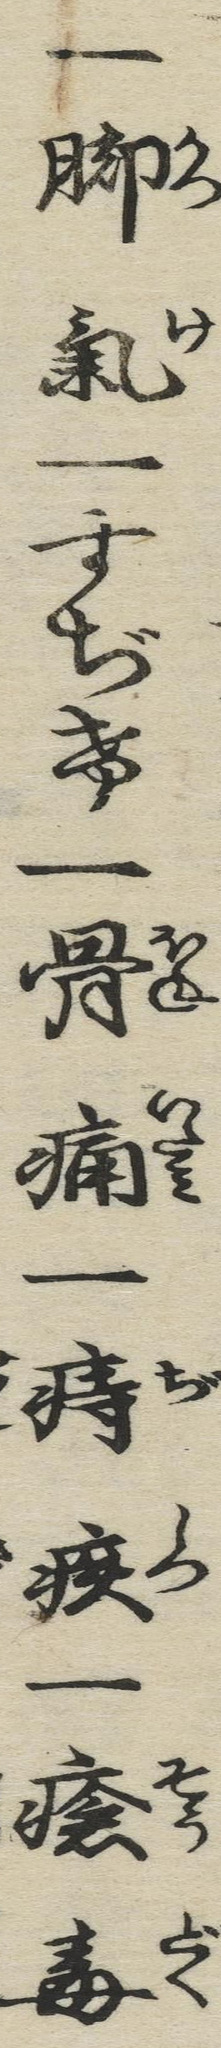一脚氣一すぢけ一骨痛一痔疾一瘡毒
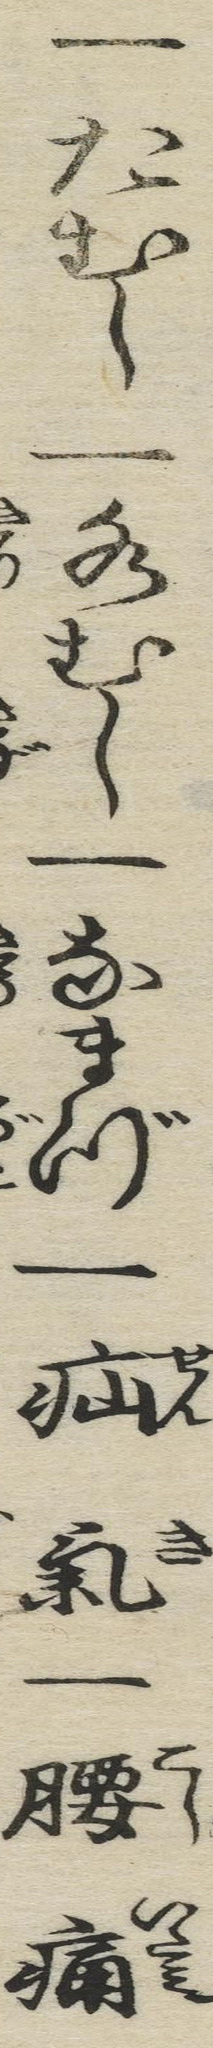一たむし一水むし一なまづ一疝氣一腰痛
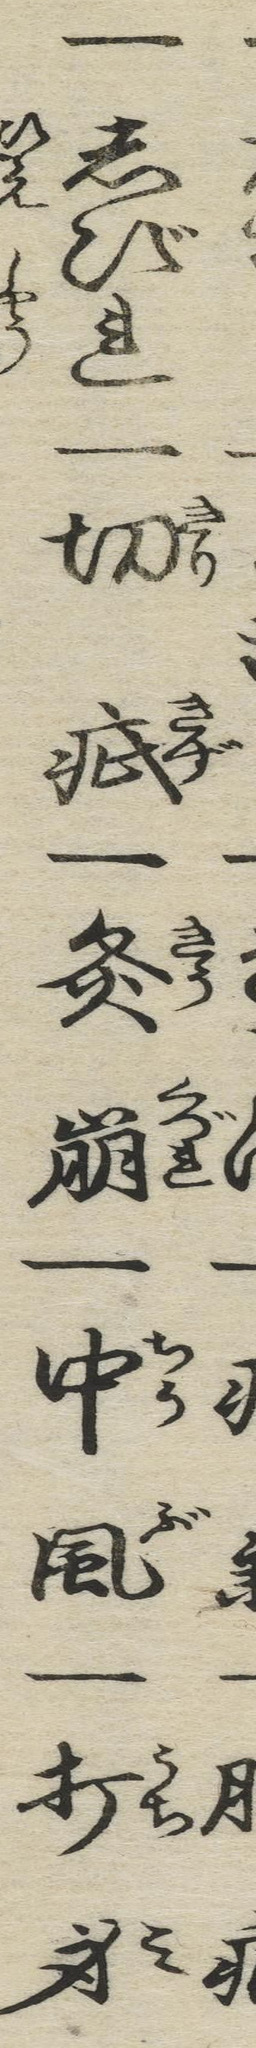一しびれ一切疵一灸崩一中風一打身
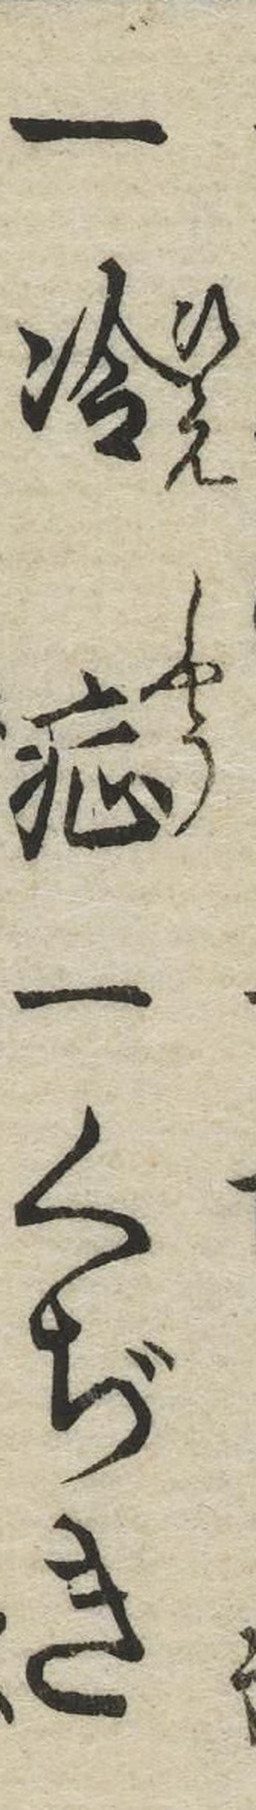一冷症一くぢき
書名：箱根七湯　温泉圖會　全
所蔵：東京大学地震研究所図書室 Earthquake Research Institute Library, The University of Tokyo, JAPAN
